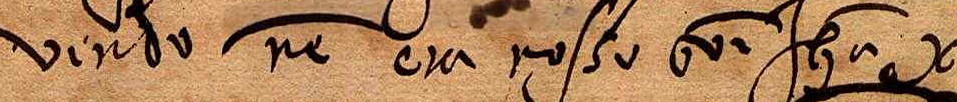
vindo nē era nosso sōr Jhū xo
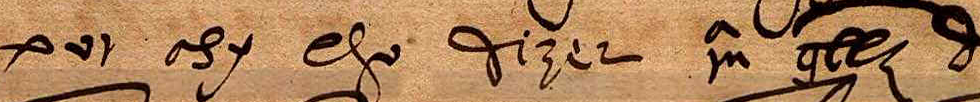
por asy lho dizer ma ḡllz de
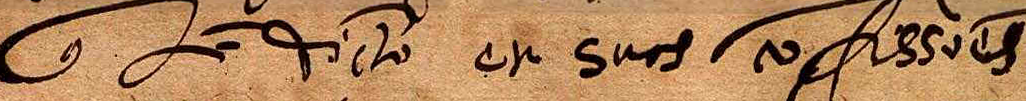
q̄ tē dict̄o en suas cōfissoẽs
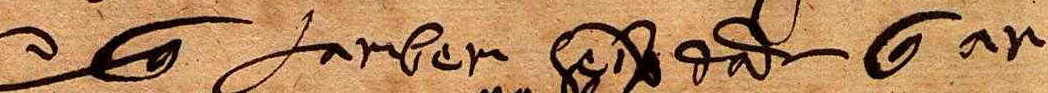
e q̄ tambem he ꝟdade q̄ an
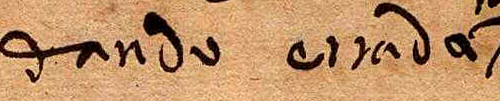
dando errada
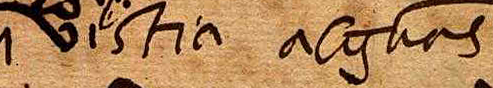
vistia alguās
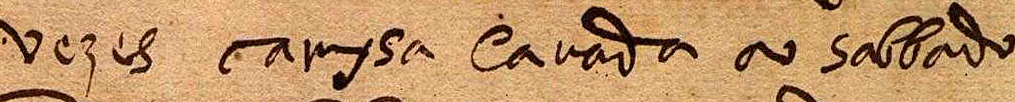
vezes camysa lauada ao sabbado
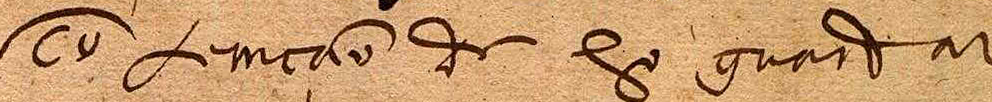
cō temçaõ de ho guardar
